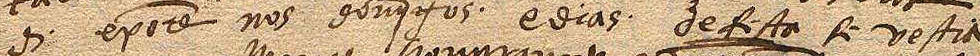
di e p̄ore nos dom̄jgos. e dias. de festa se vestia
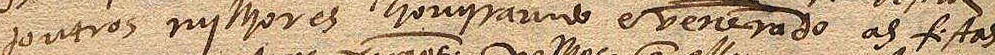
doutros mjlhores homrramdo e vener̄ado as festas
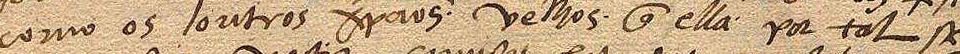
como os outros xpãos. velhos. q̄ ella. por tal se
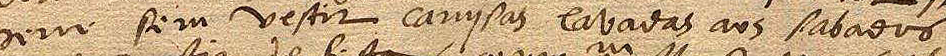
tem. sem vestir camjsas lavadas aos sabados
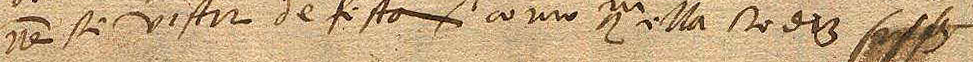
n̄e se vistir de festa / como ꝯ̄ ella se diz _
